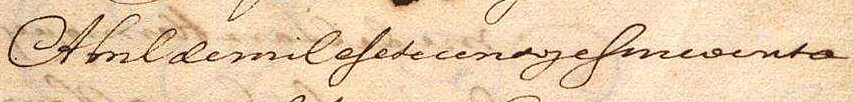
Abril de mil e setecentos e sincoenta
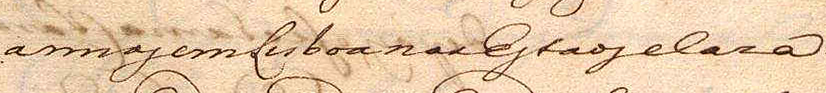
annos em Lisboa nos Estaos e Caza
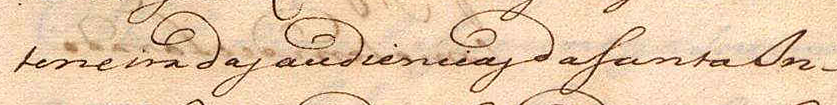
terceira das audiencias da santa In
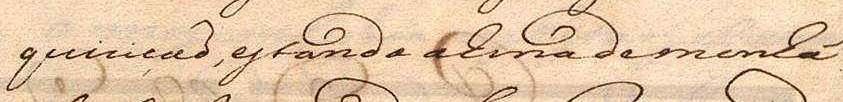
quiziçaõ, estando ahi na de menhã
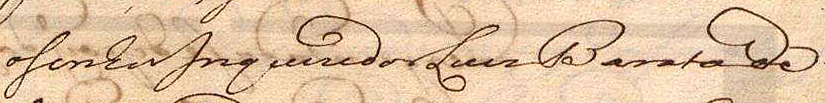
o senhor Jnquizidor Luiz Barata de
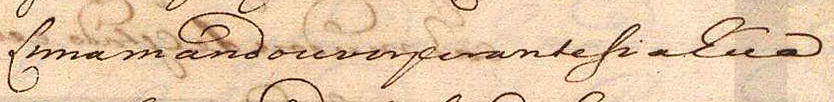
Lima mandou vir perante si a hūa
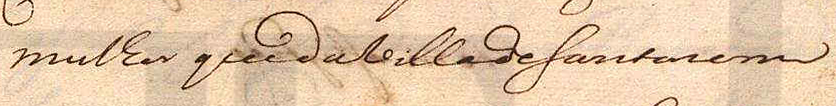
mulher que da Villa de santarem
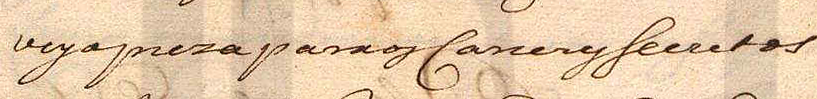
veyo preza para os Carceres secretos
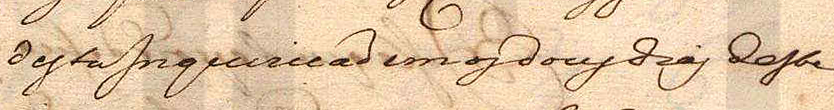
desta Jnquiziçaõ em os dous dias deste
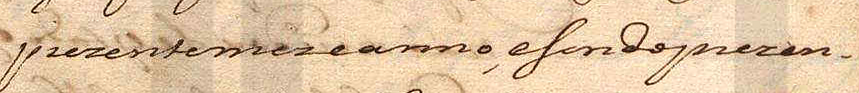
prezente mez e anno, e sendo prezen
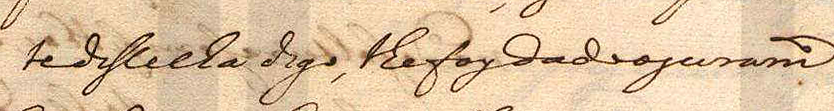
te disse cha digo, lhe foy dado o juramto
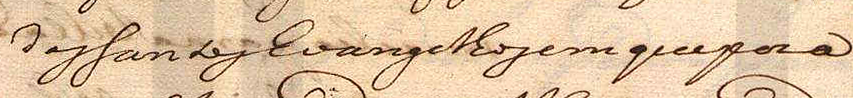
dos santos Evangelhos em que poz a
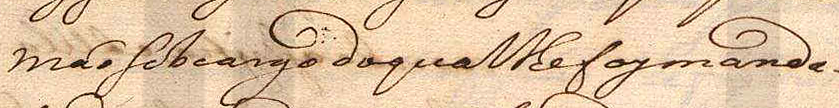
maõ sob cargo do qual lhe foy manda
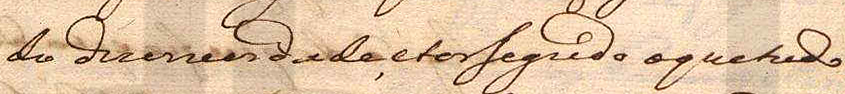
do dizer verdade, e ter segredo o que tudo
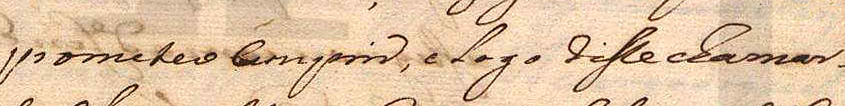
prometeo cumprir, e Logo disse chamar
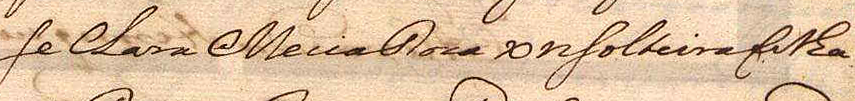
se Clara Mecia Roza xn solteira filha
